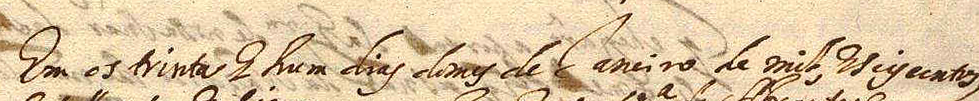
Em os trinta E hum dias do mes de Ianeiro de mil, E seiscentos
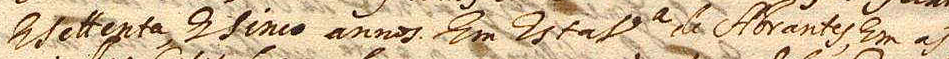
E settenta, e sinco annos Em Esta Va de Abrantes Em as
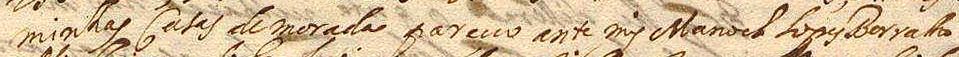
minhas Casas de morada pareceo ante my Manoel Lopes Borralho
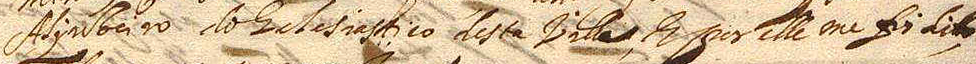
Alyubeiro do Eclesiastico desta Villa, E por elle me foi ditto
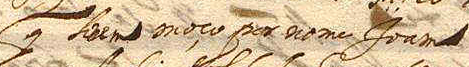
q̄ hum moço por nome Joam
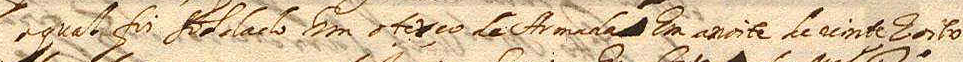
o qual foi soldado Em o terço da Armada Em a noite de uinte E oito
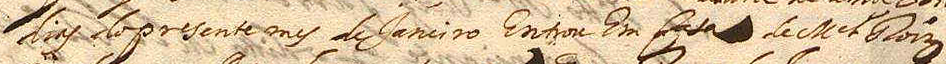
dias do presente mes de Janeiro Entrou Em Casa de Mel Roiz̄
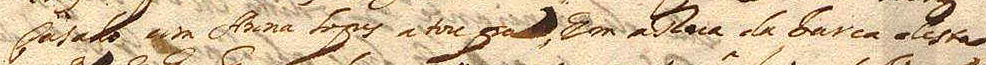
Casado com Anna Lopes a toupa, Em a Rua da barca desta
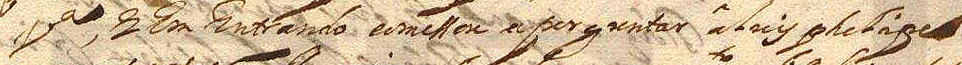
Va, E em Entrando comessou a perguntar a Luis phelipe
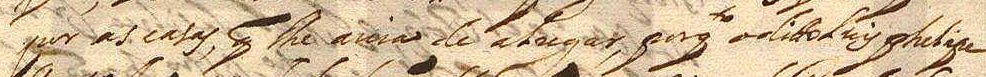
por as casas, q̄ lhe auia de alugar, porq̄ o ditto luis phelipe
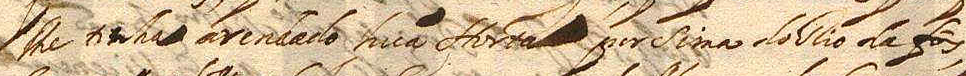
lhe tinha arendado huā Horta por sima do Rio da fós,
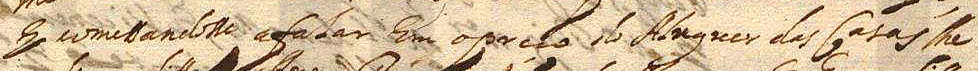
E comessandosse a falar Em o preço de Aluguer das Casas lhe
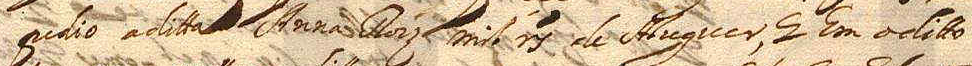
pedio a ditta Anna Roiz̄ mil rs̄ de Aluguer, E Em o ditto
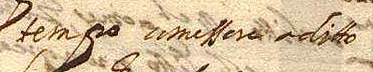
tempo comessou o ditto
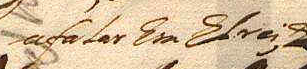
a falar Em El rei, E
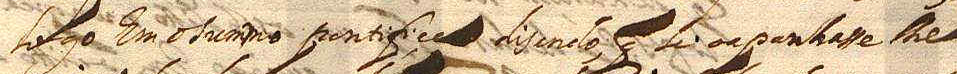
logo Em o summo pontifice, disendo q̄ se o apanhasse lhe
